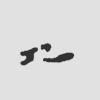亓（其）
